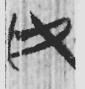女
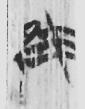隹
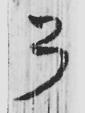乃
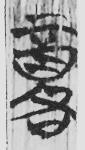{复口}
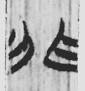非
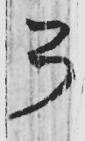乃
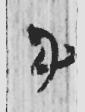身
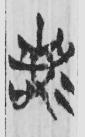若
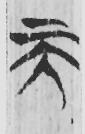天
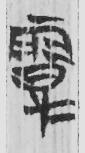{雨旱}
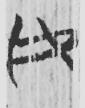女
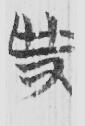拃（作）
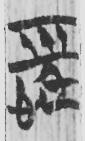{㸒心}
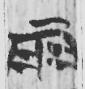雨
